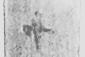十
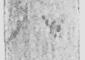八
